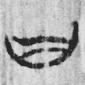曰
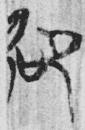卲（召）
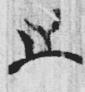之
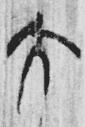大（太）
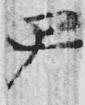子
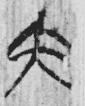內（入）
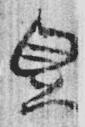見
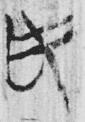女（如）
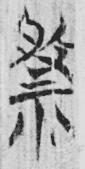祭
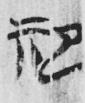祀
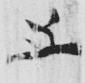之
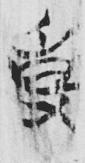事
